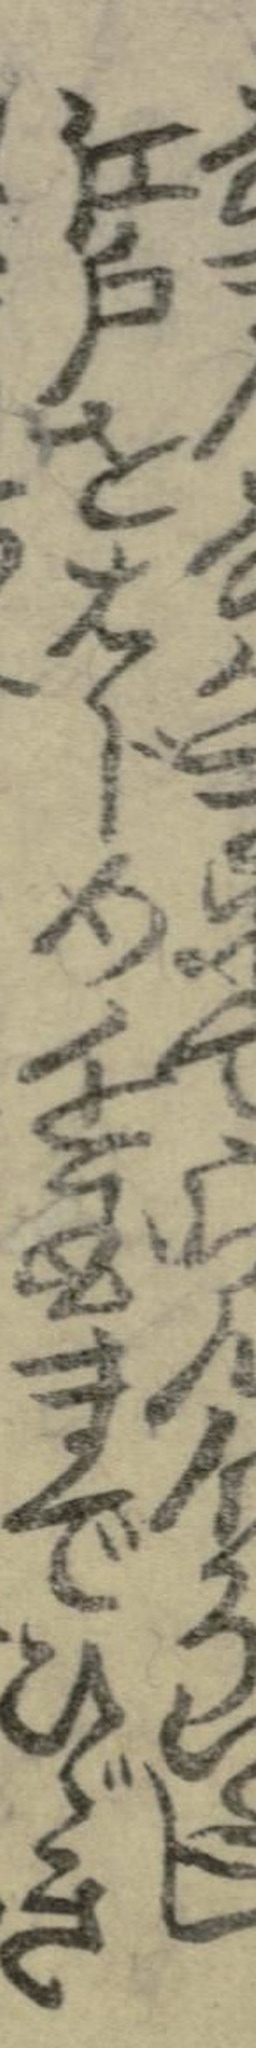江戸をはじめ近国までひゞき
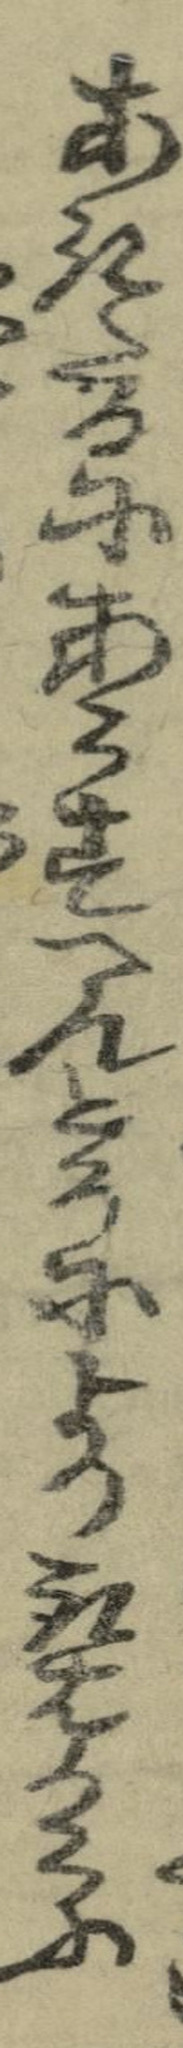あきたるにあらすへんとうにより取はからふ
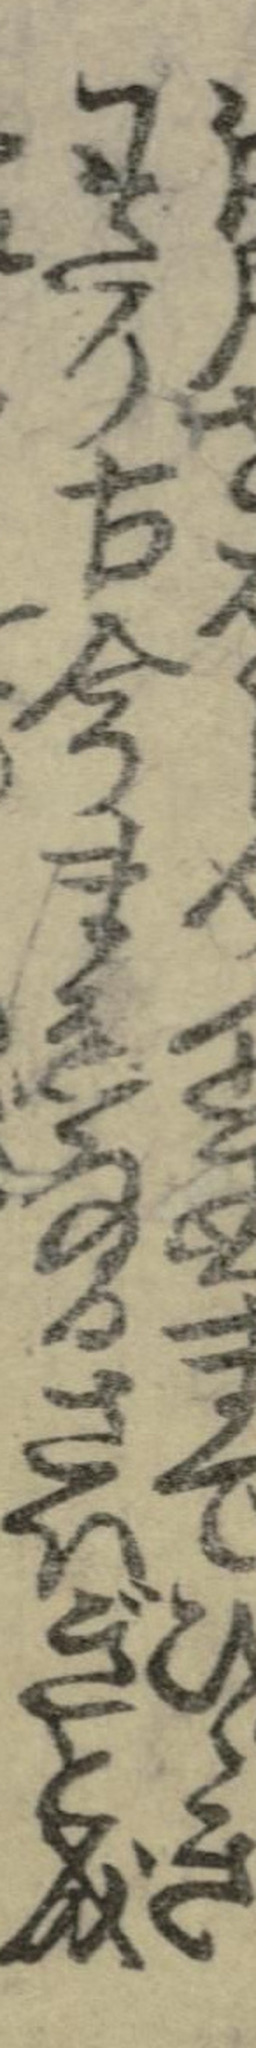わたり古今まれなるさはぎと成
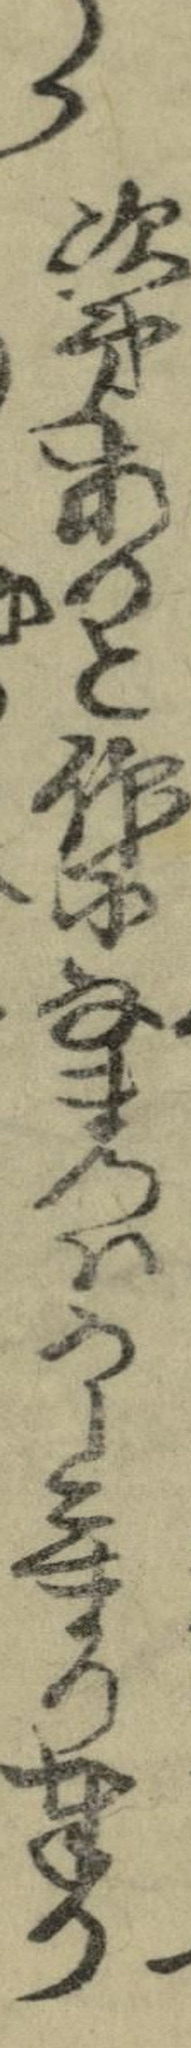次第ありと神になまつはかしこまり奉り
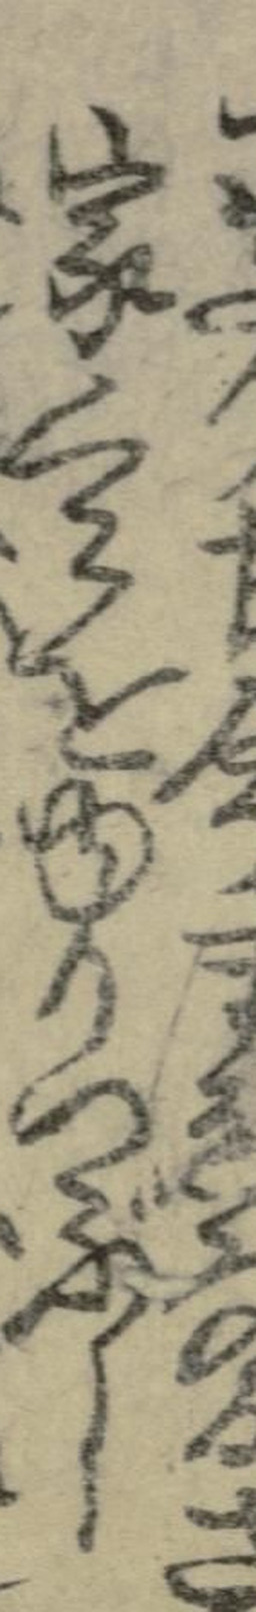家くニをゆりつぶし
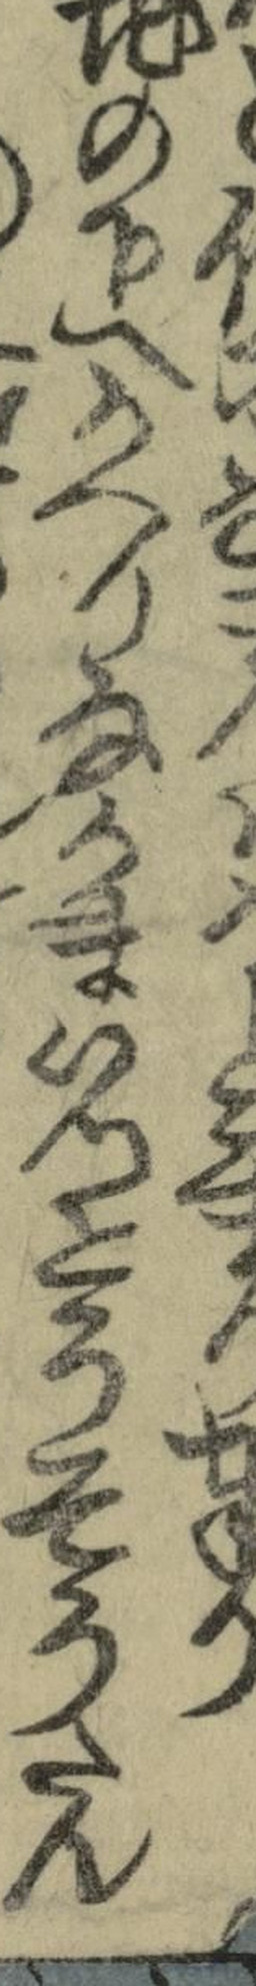地の下へかへりなかまいつとうそうたん
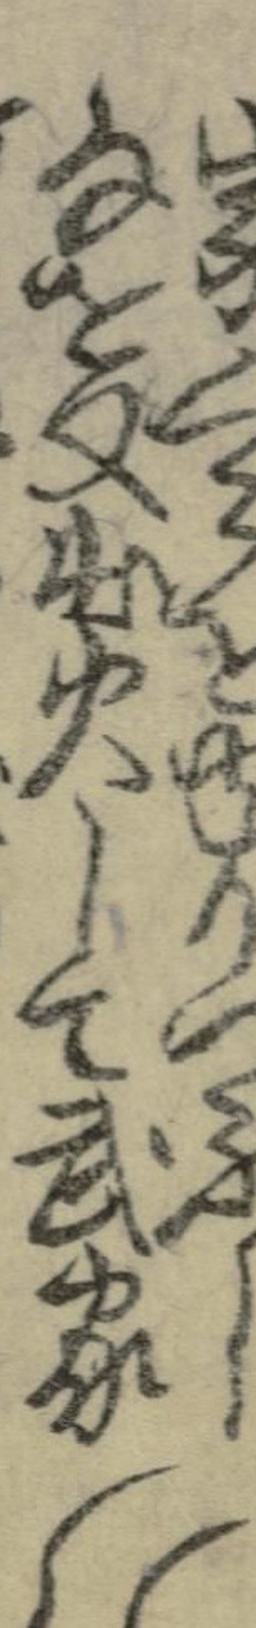なを又出火して武家
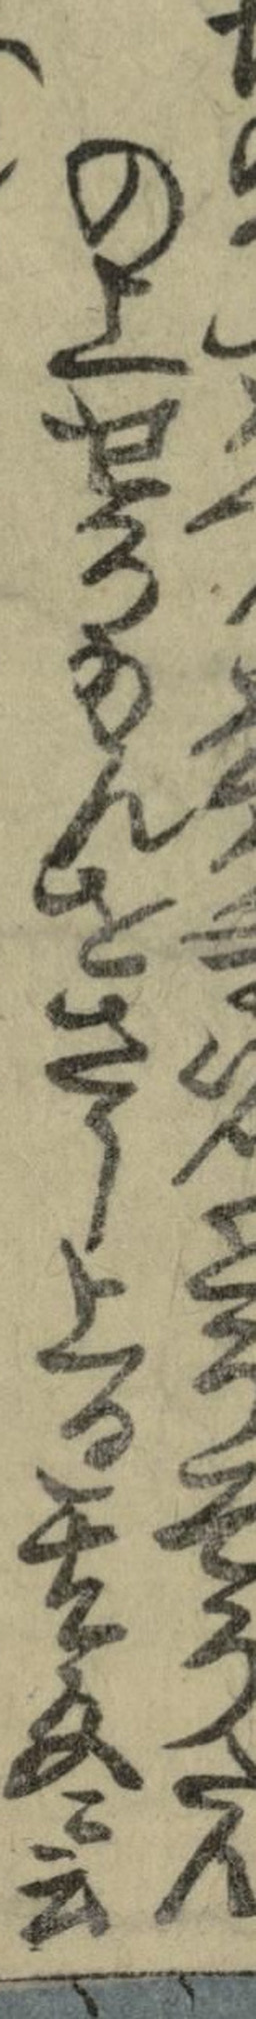の上せうもんをさし上る其うへニ云
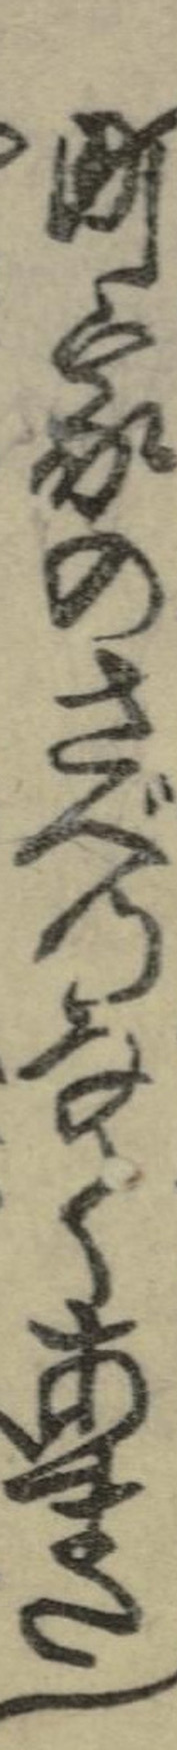町家のさべつなくあまた
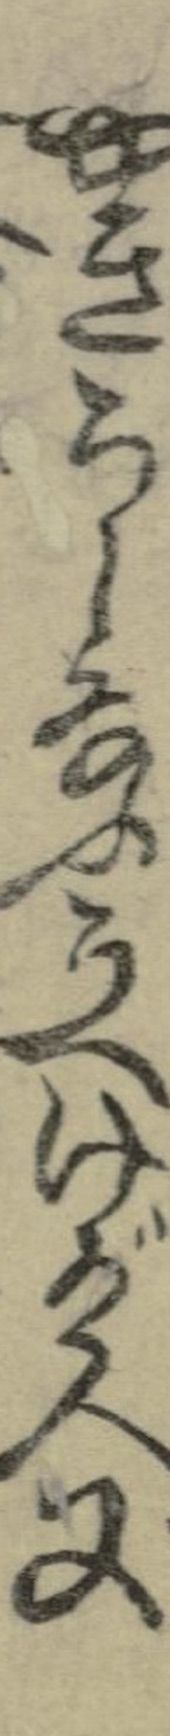やきうしなふうへけが人又
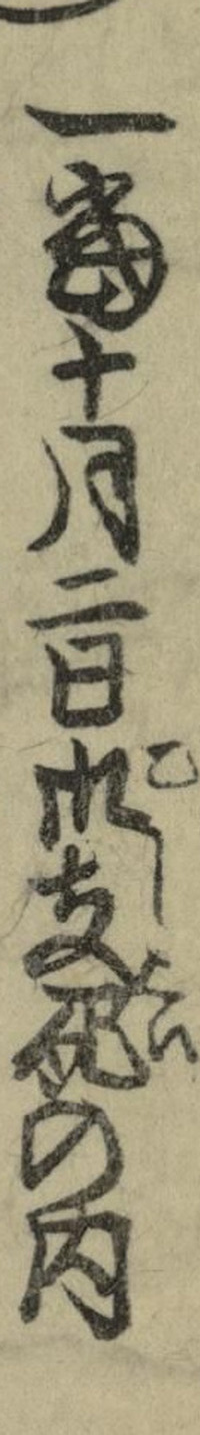一当十月二日御支配の内
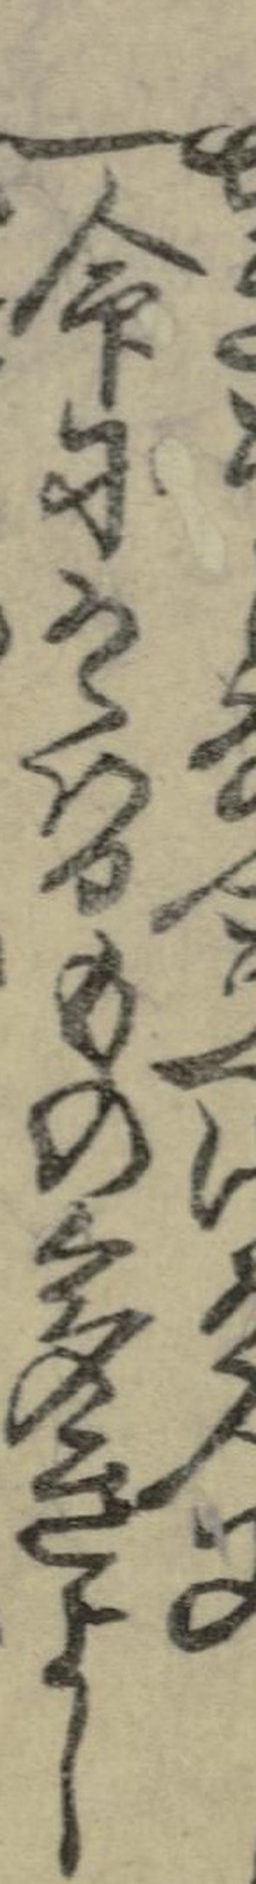一命にかゝはるもの多きよし
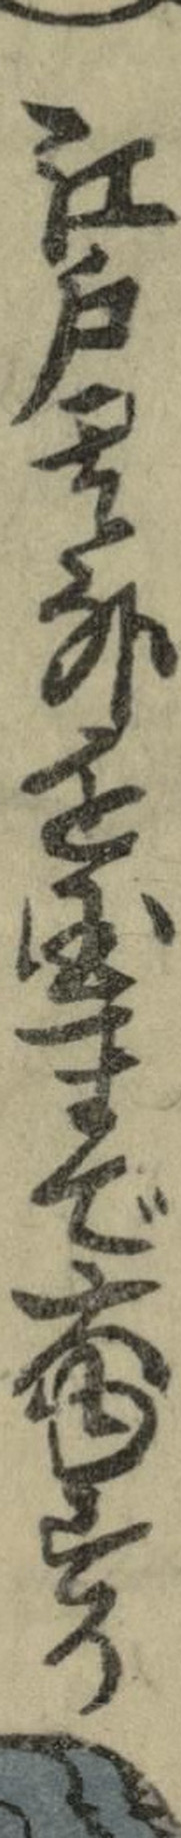江戸其外近国まで大ゆすり
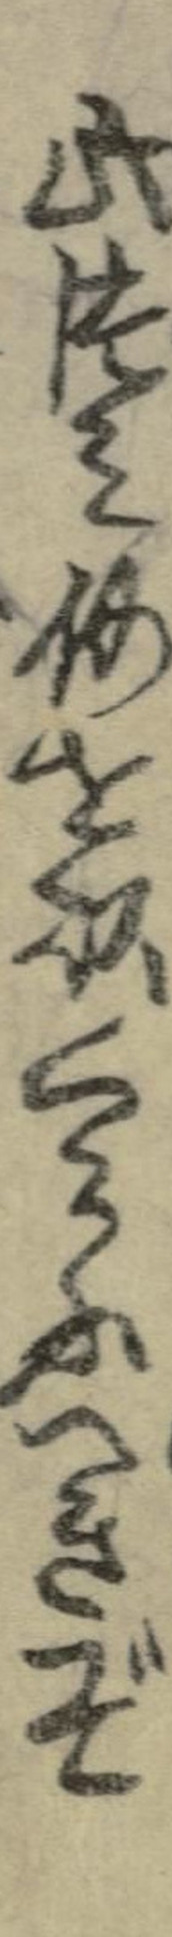此つみ何を以くらふへきぞ
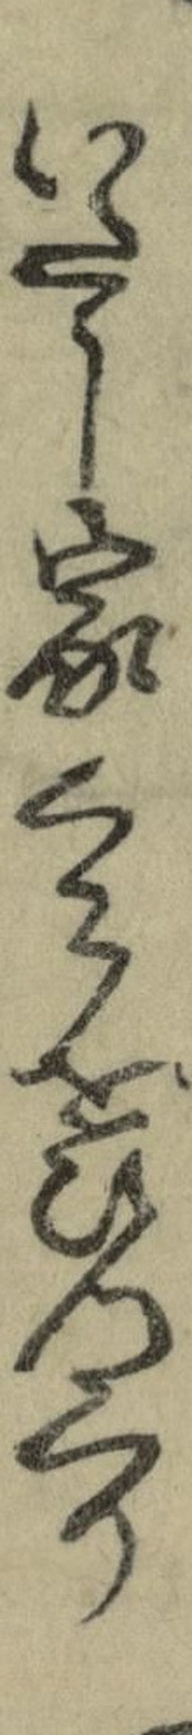いたし家くニをひつくり
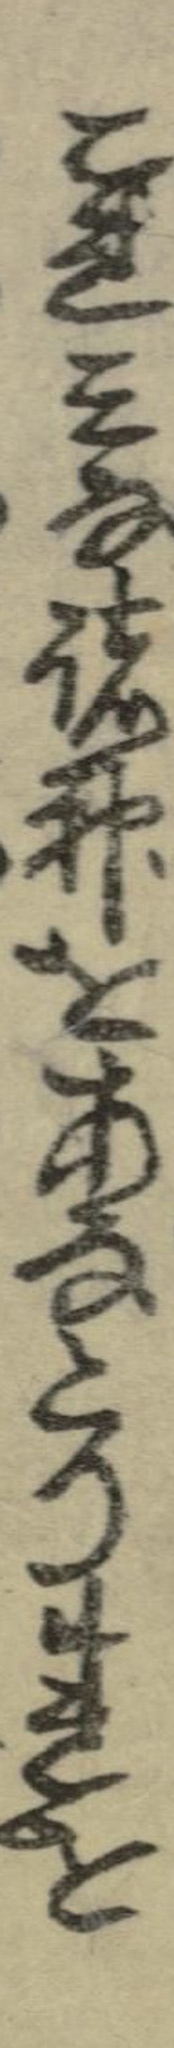これみな諸神をあなとりこれを
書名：鹿島大神宮託曰
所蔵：東京大学地震研究所図書室 Earthquake Research Institute Library, The University of Tokyo, JAPAN
